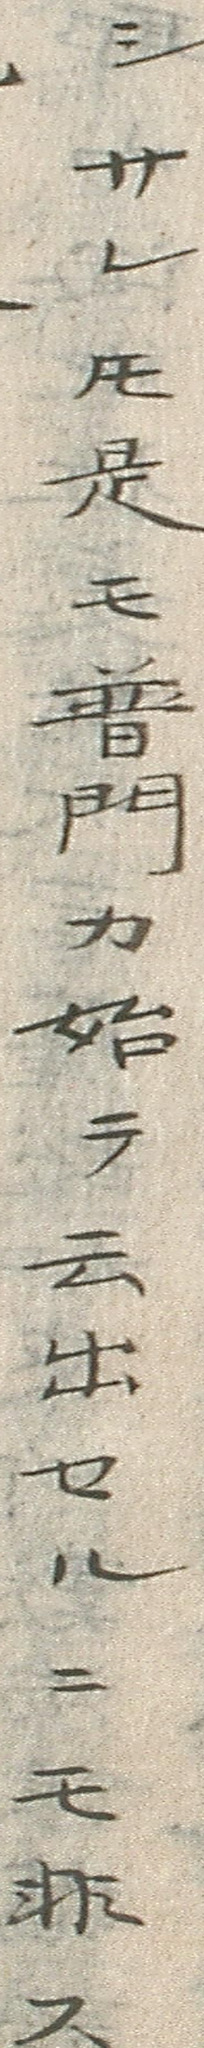シサレトモ是モ普門カ始テ云出セルニモ非ス
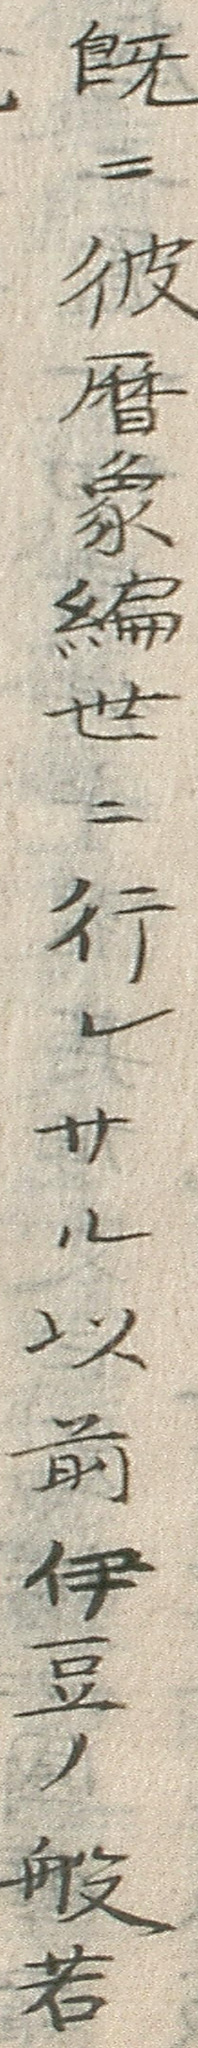既ニ彼暦象編世ニ行レサル以前伊豆ノ般若
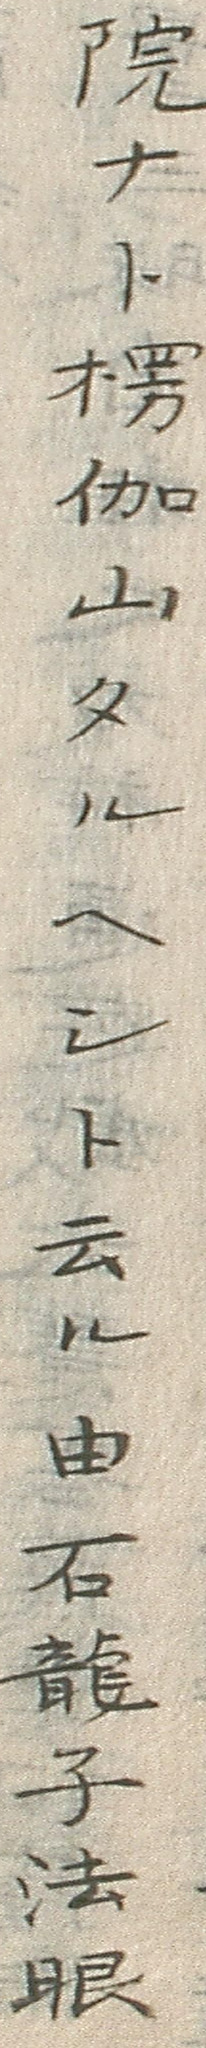院ナト楞伽山タルヘシト云ル由石龍子法眼
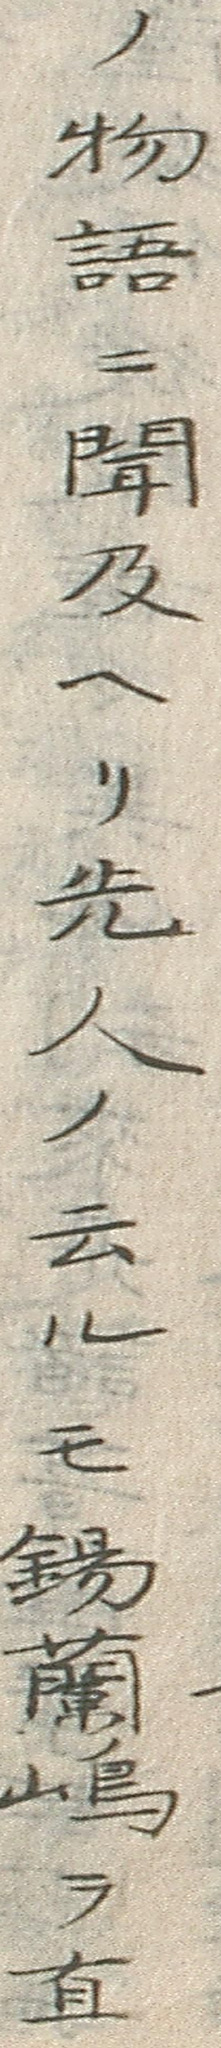ノ物語ニ聞及ヘリ先人ノ云ルモ錫蘭嶋ヲ直
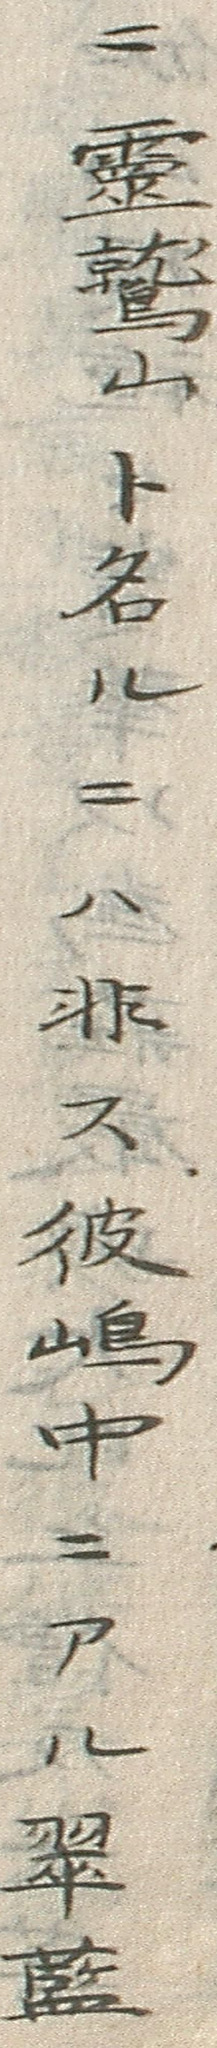ニ霊鷲山ト名ルニハ非ス彼嶋中ニアル翠藍
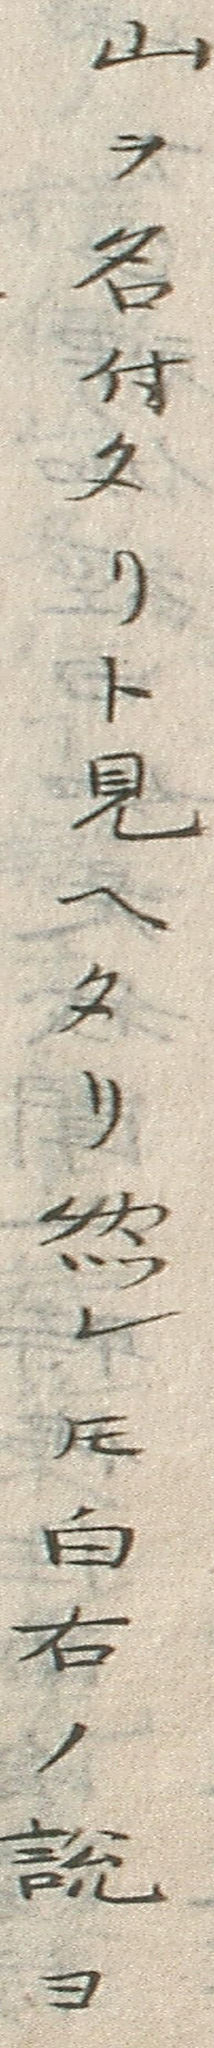山ヲ名付タリト見ヘタリ然レトモ白右ノ説ヨ
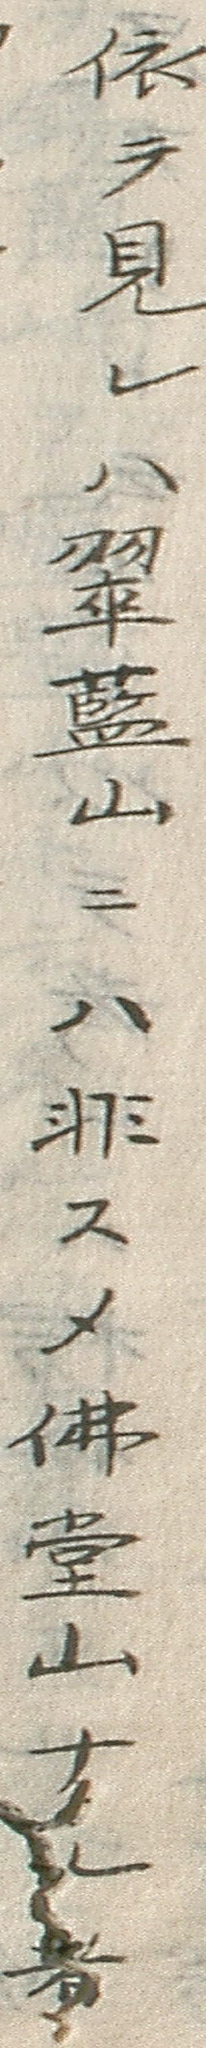依テ見レハ翠藍山ニハ非スシテ仏堂山ナル者
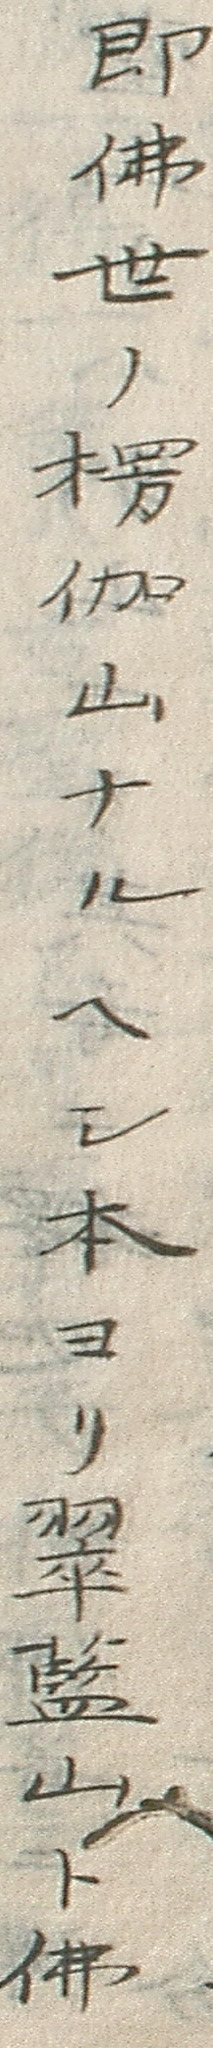即仏世ノ楞伽山ナルヘシ本ヨリ翠藍山ト仏

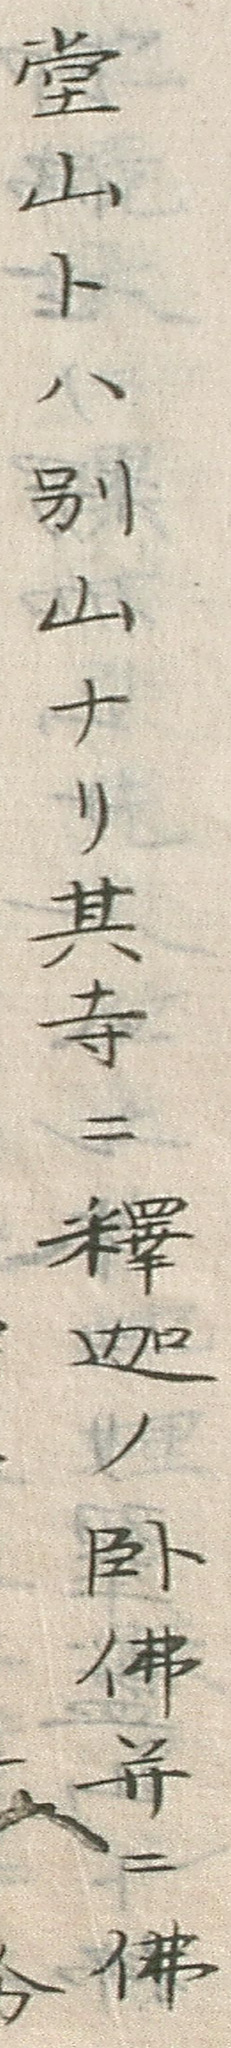堂山トハ別山ナリ其寺ニ釈迦ノ臥仏并ニ仏
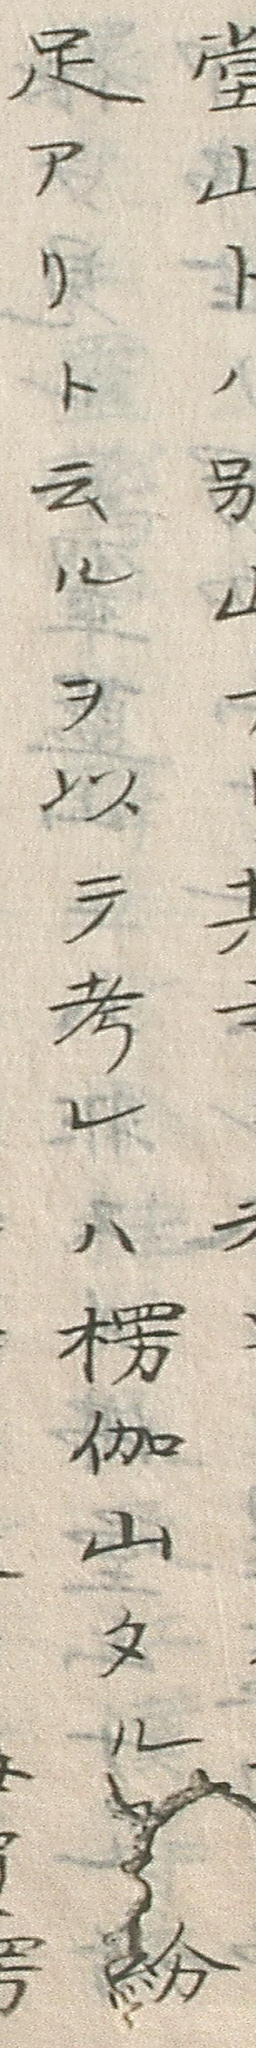足アリト云ルヲ以テ考レハ楞伽山タルコト紛
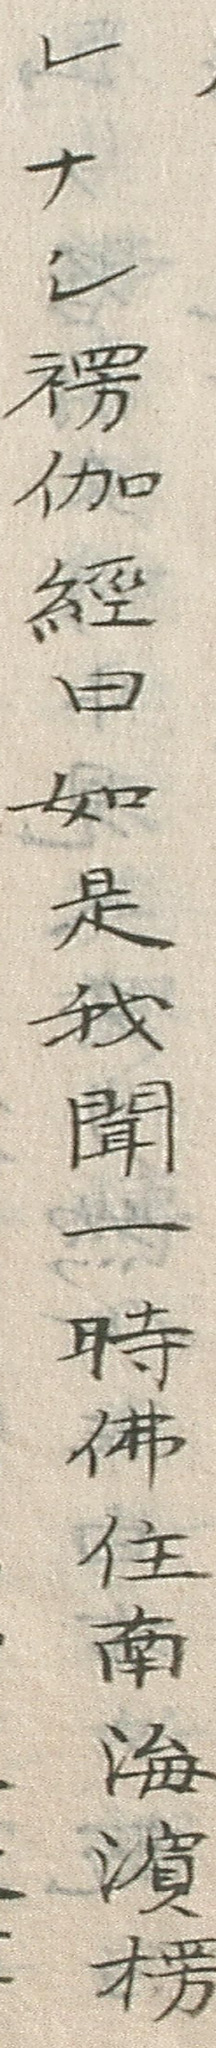レナシ楞伽経曰如是我聞一時仏住南海浜楞
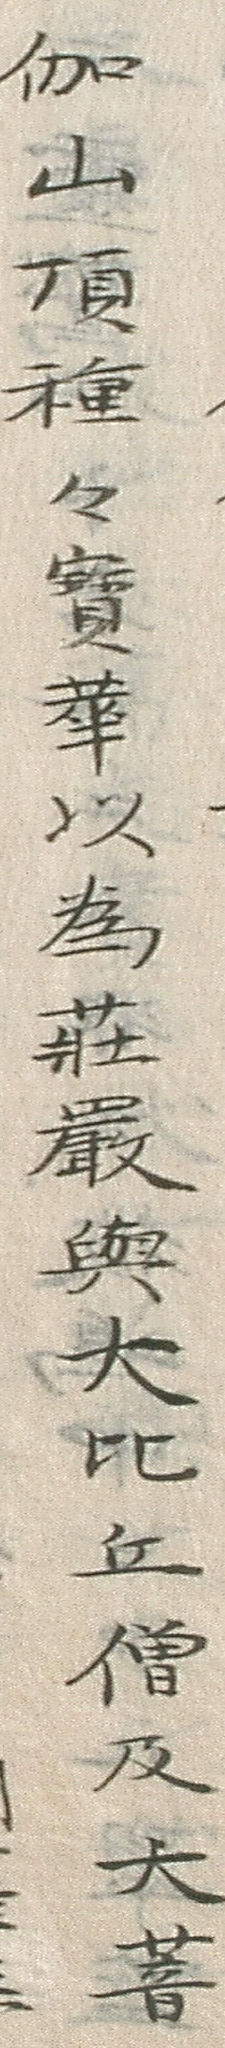伽山頂種々宝華以為荘厳与大比丘僧及大菩
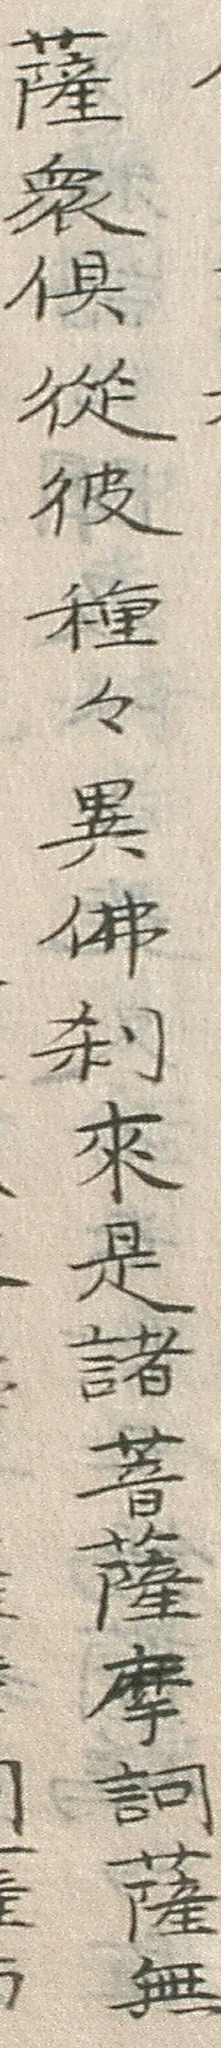薩衆俱従彼種々異仏刹来是諸菩薩摩訶薩無
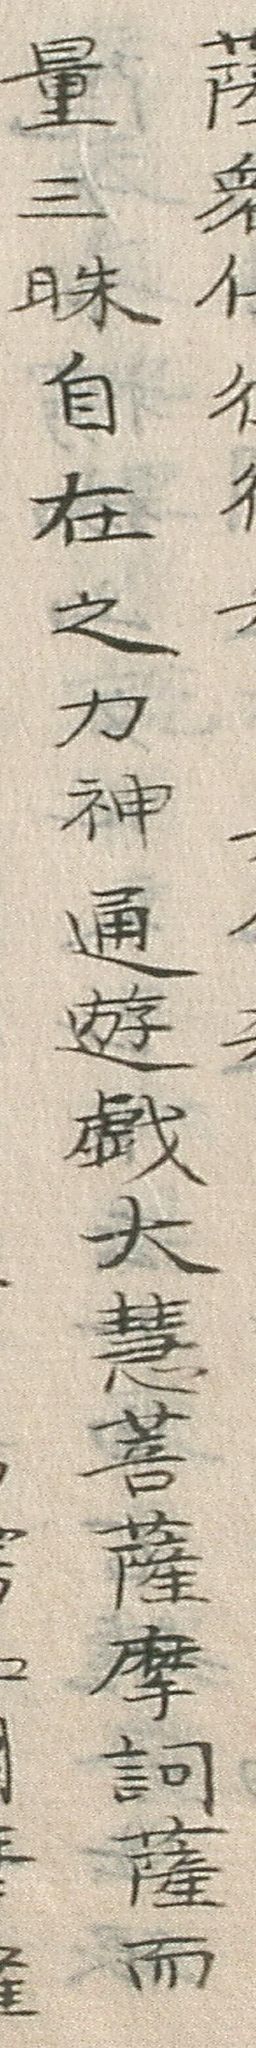量三昧自在之力神通遊戯大彗菩薩摩訶薩而
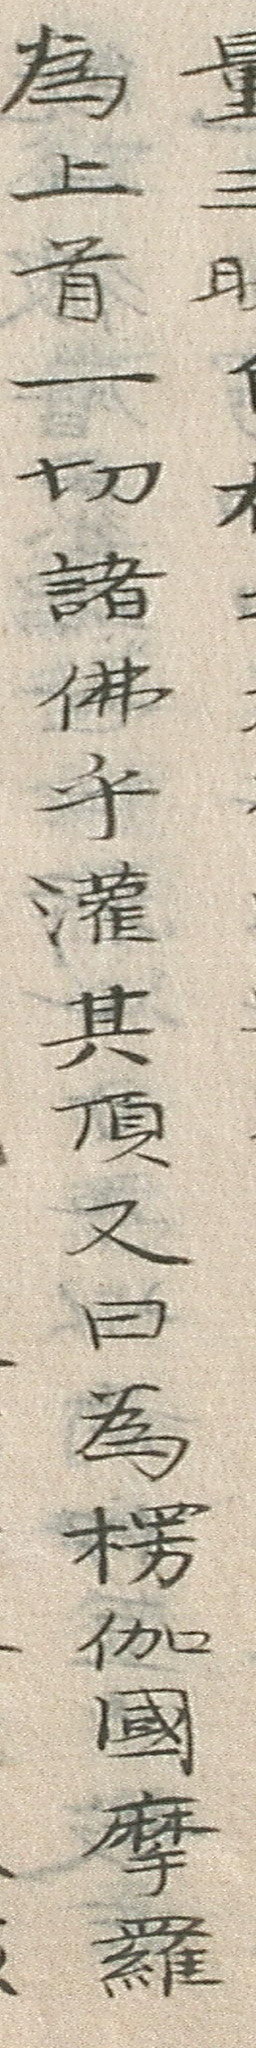為上首一切諸仏乎灌其頂又曰為楞伽国摩羅
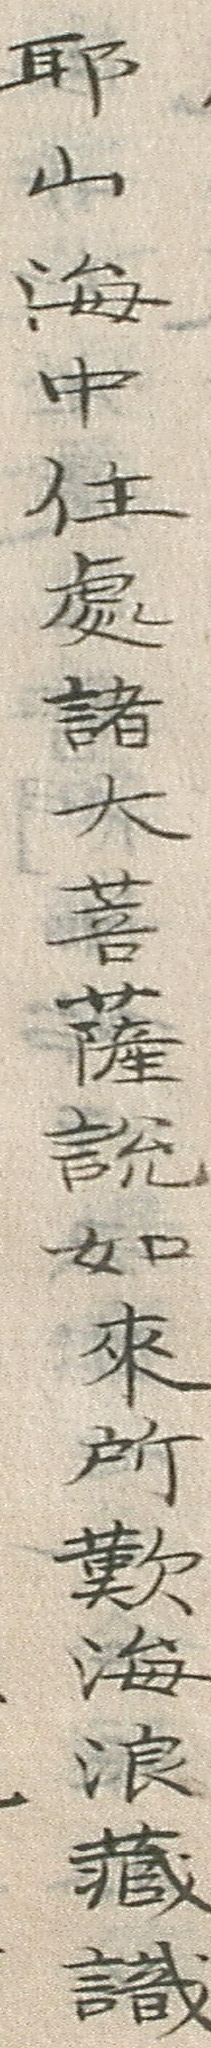耶山海中住処諸大菩薩説如来所歎海浪蔵識
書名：天學略名目羽翼　全
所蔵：東京大学地震研究所図書室 Earthquake Research Institute Library, The University of Tokyo, JAPAN
